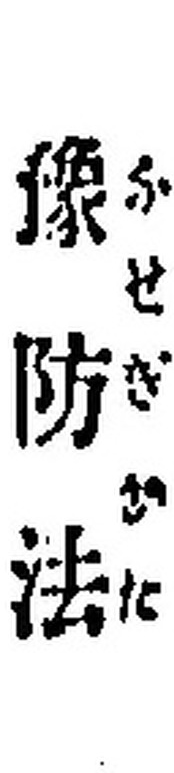豫防法
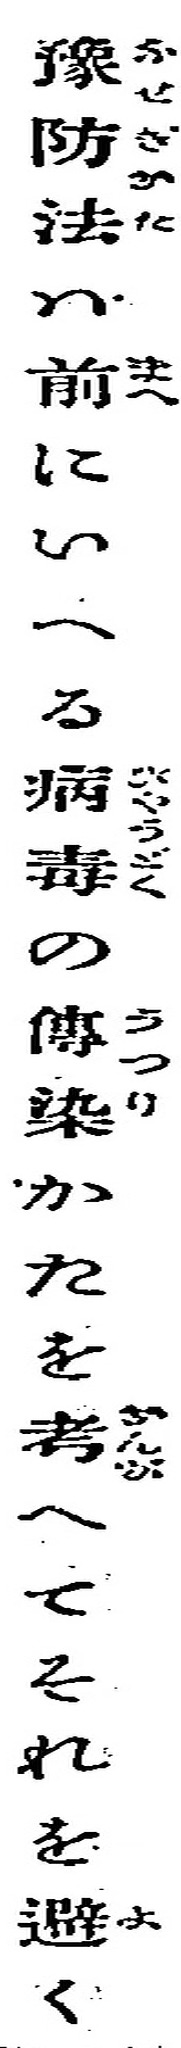豫防法は前にいへる病毒の傳染かたを考へてそれを避く
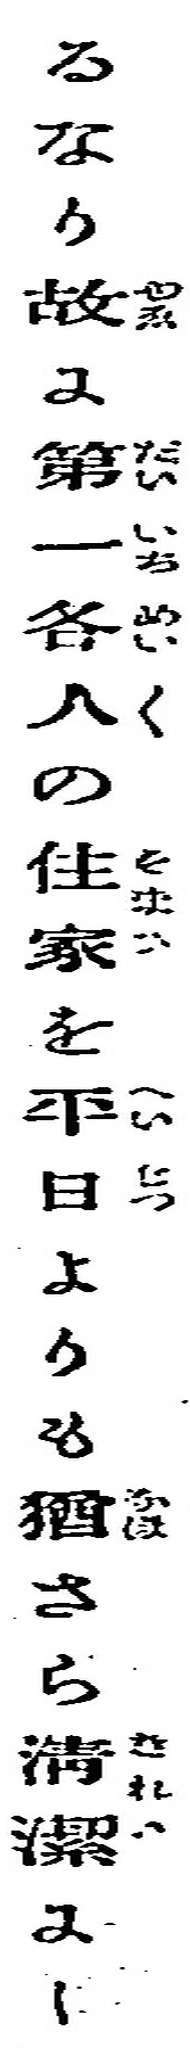るなり故に第一各人の住家を平日よりも猶さら清潔にし
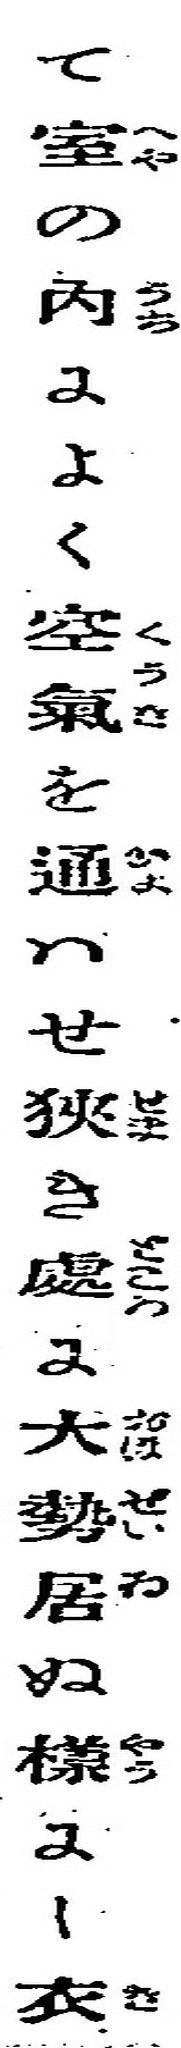て室の内によく空気を通はせ狭き處に大勢居ぬ様にし衣
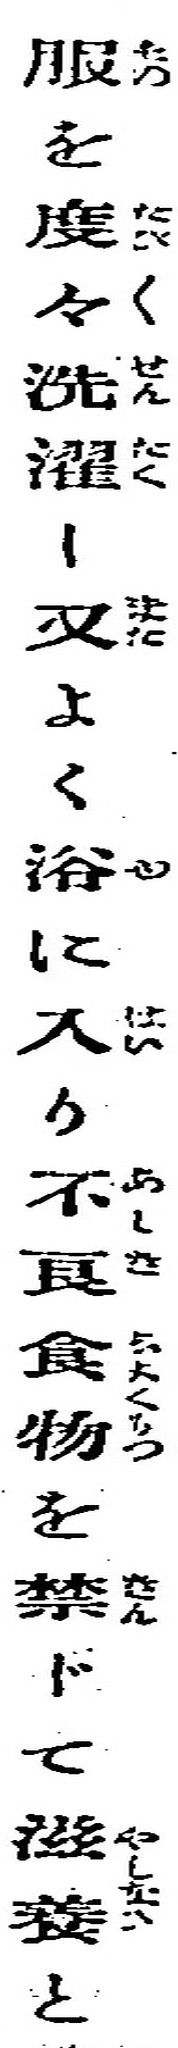服を度々洗濯し又よく浴に入り不良食物を禁じて滋養と
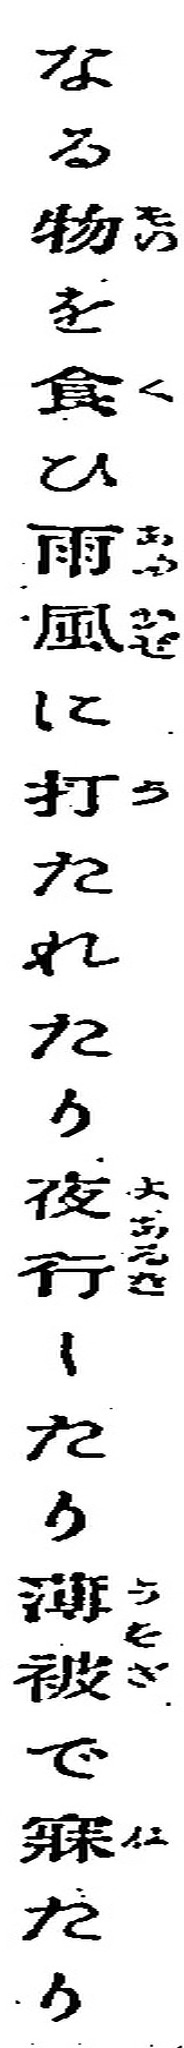なる物を食ひ雨風に打たれたり夜行したり薄被で寝たり
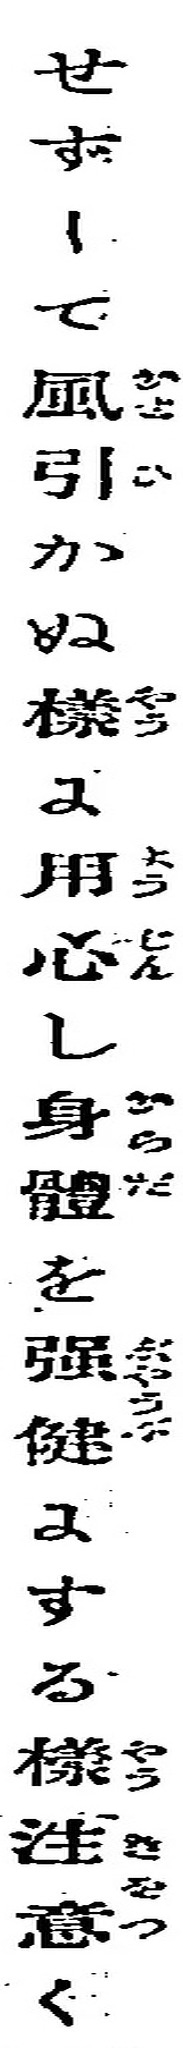せずじて風引かぬ様に用心し身體を強健にする様注意く

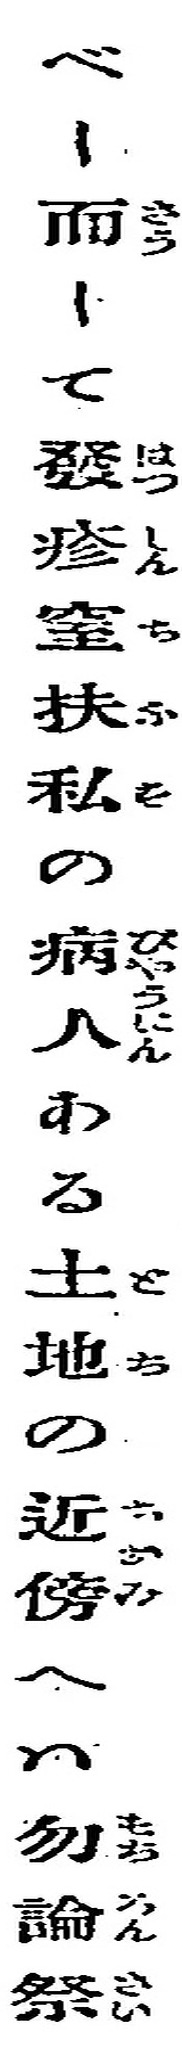べし而して発疹窒扶私の病人ある土地の近傍へは勿論祭
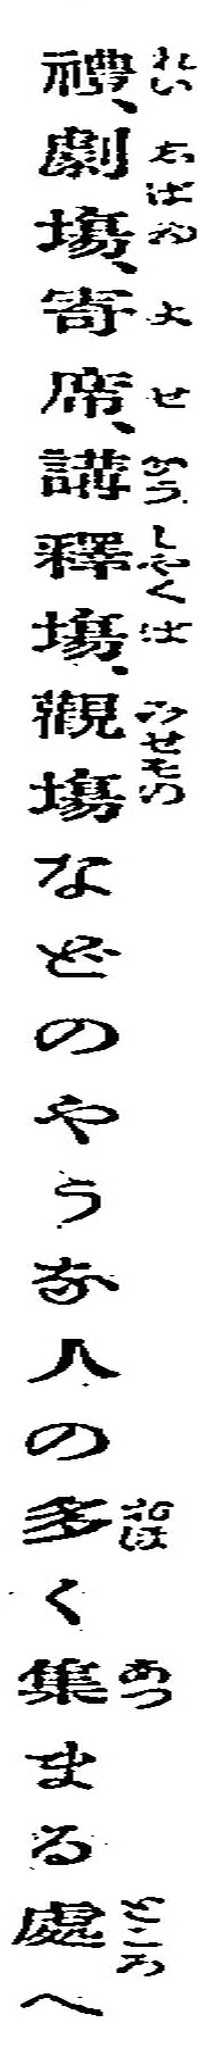禮、劇場、寄席、講釈場観場などのやうな人の多く集まる處へ
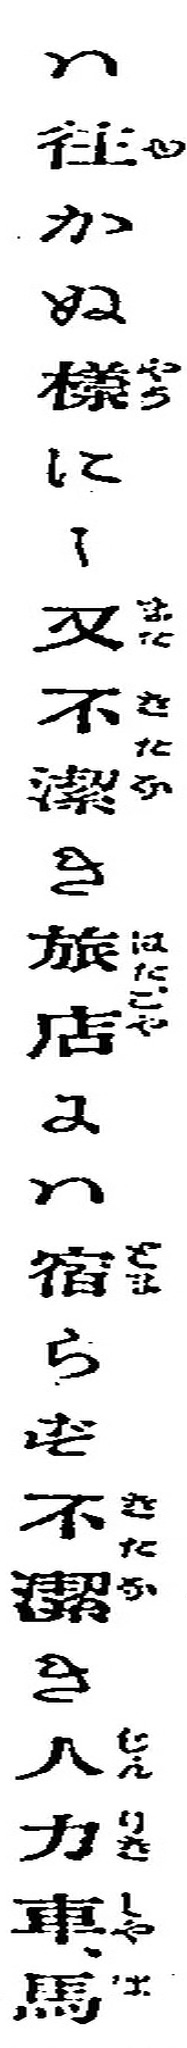は往かぬ様にし又不潔き旅店には宿らず不潔き人力車、馬
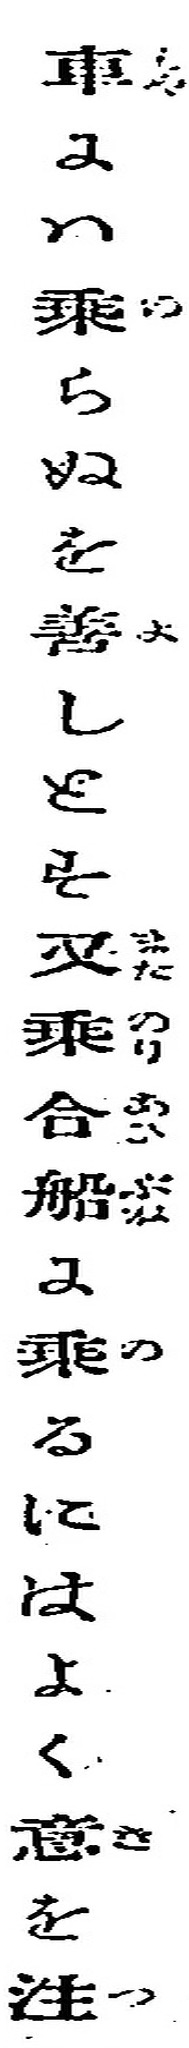車には乗らぬを善しとす又乗合船に乗るにはよく意を注
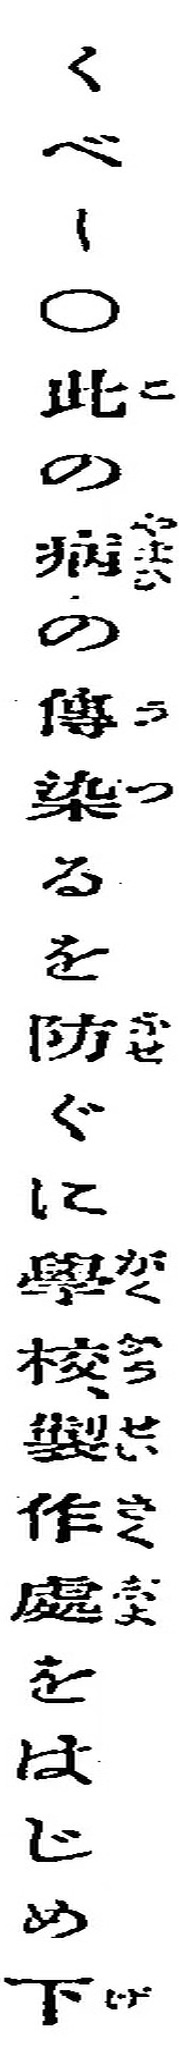くべし〇此の病の傳染るを防ぐに學校、制作處をはじめ下
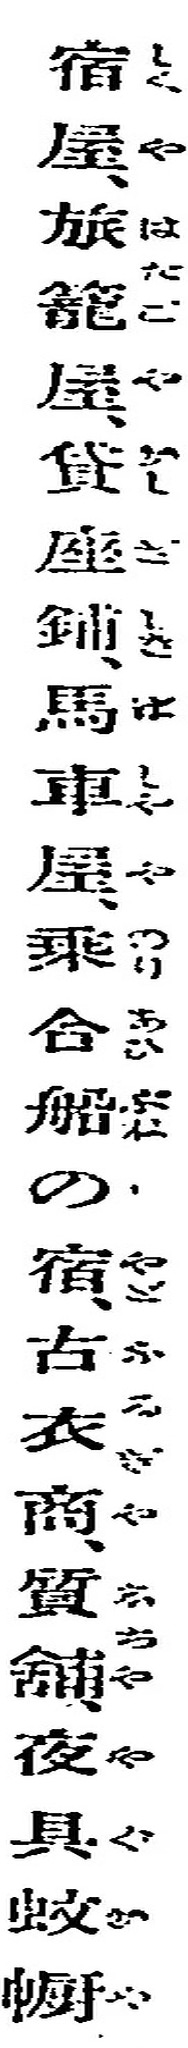宿屋、旅籠屋、貸座鋪、馬車屋、乗合船の宿、古衣商、質舖、夜具蚊幮
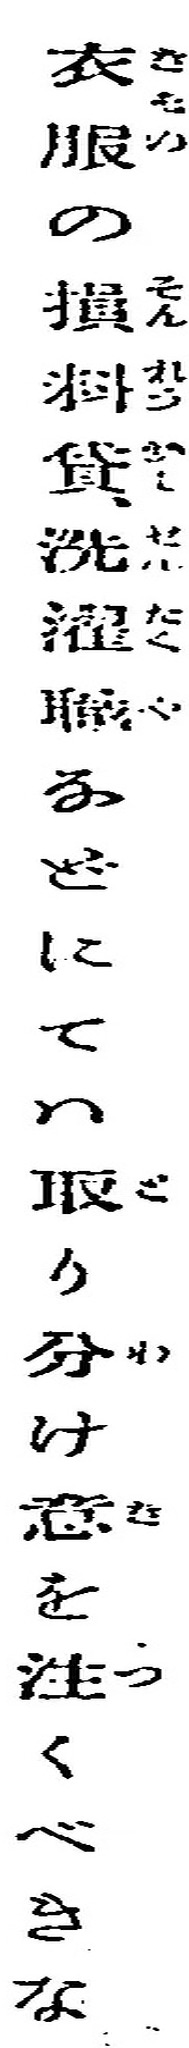衣服の損料貸、洗濯職などにては取り分け意を注くべきな
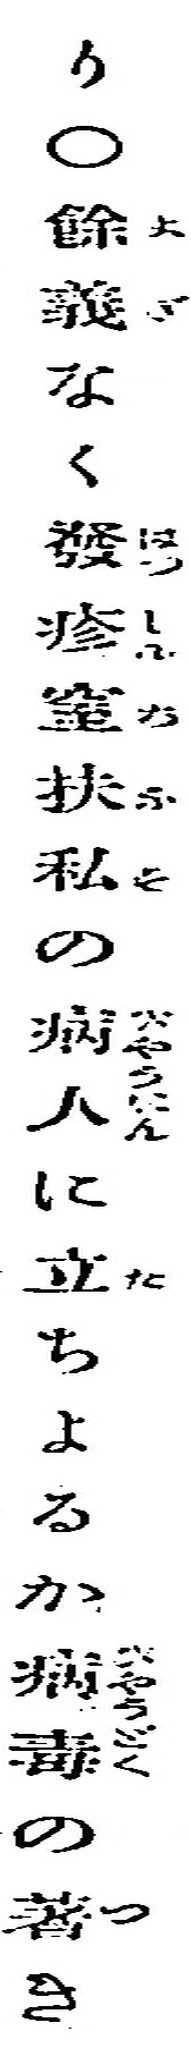り〇餘義なく発疹窒扶私の病人に立ちよるか病毒の著き
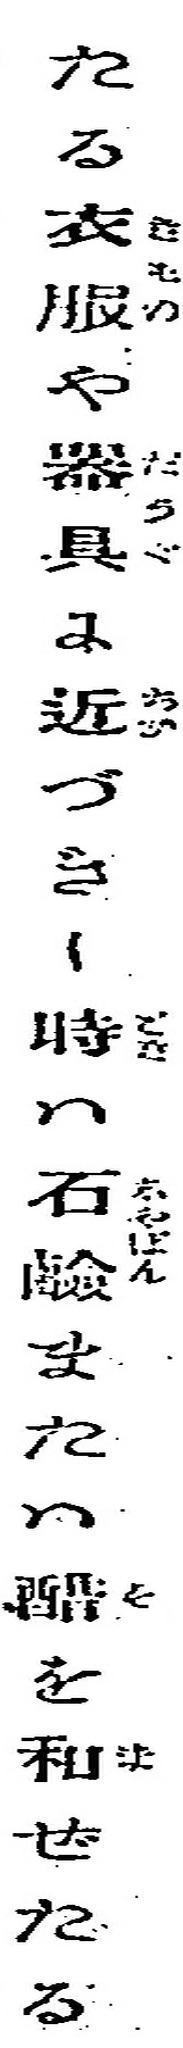たる衣服や器具に近づきし時は石鹸または醋を和ぜたる
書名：発疹窒扶私予防の訓
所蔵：国立国会図書館 National Diet Library, JAPAN
